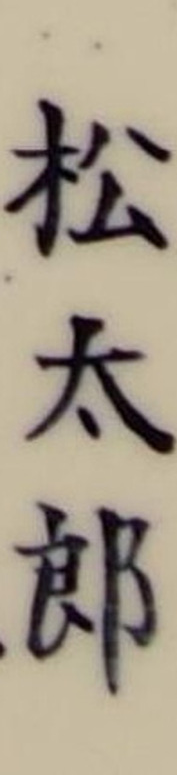松太郎
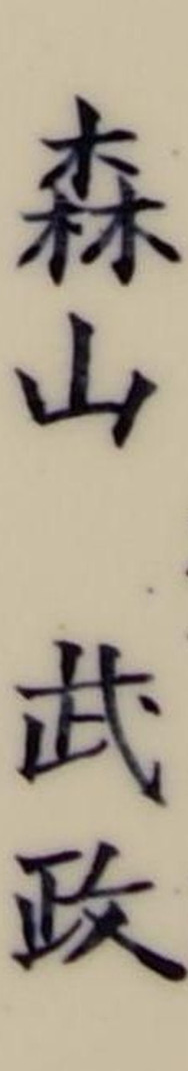森山武政
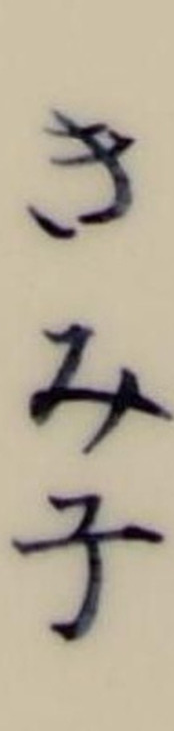きみ子
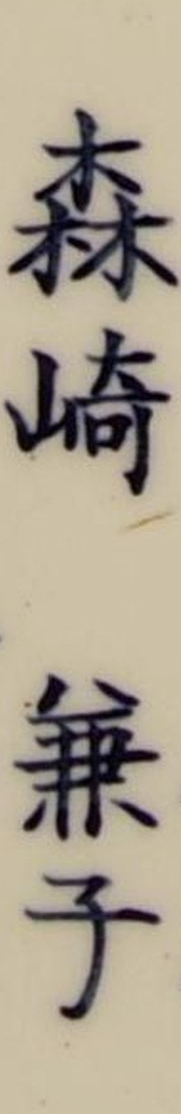森崎兼子
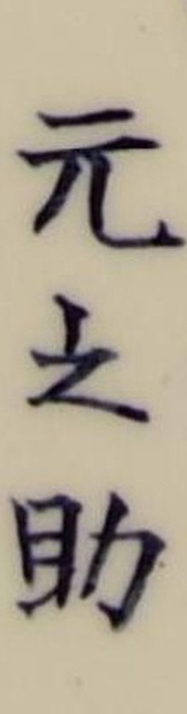元之助
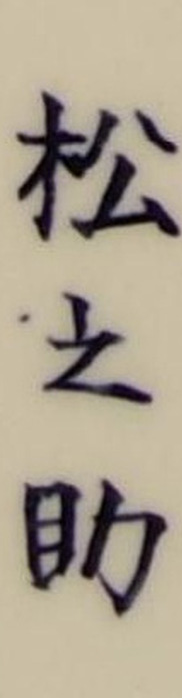松之助
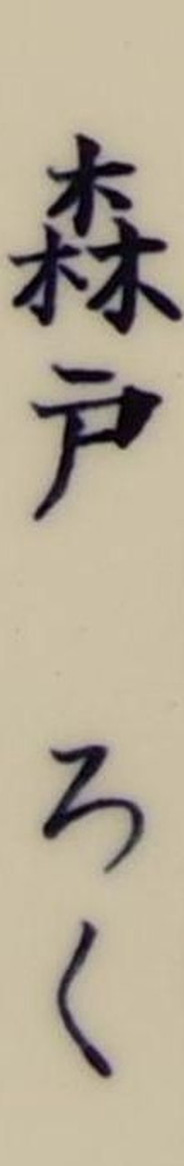森戸ろく

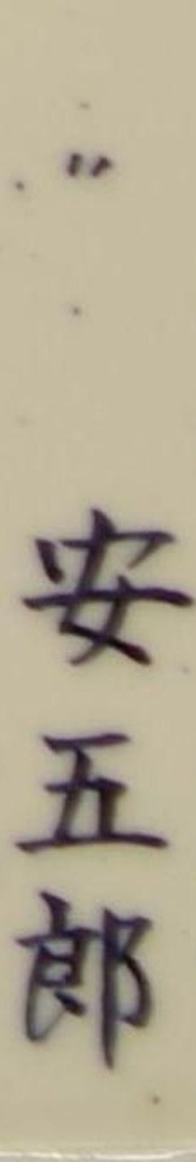安五郎
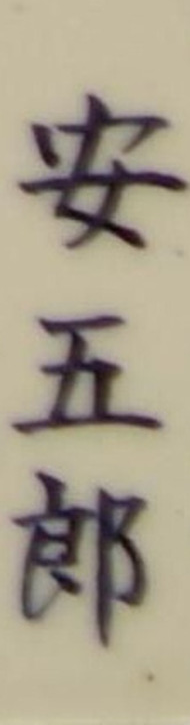安五郎
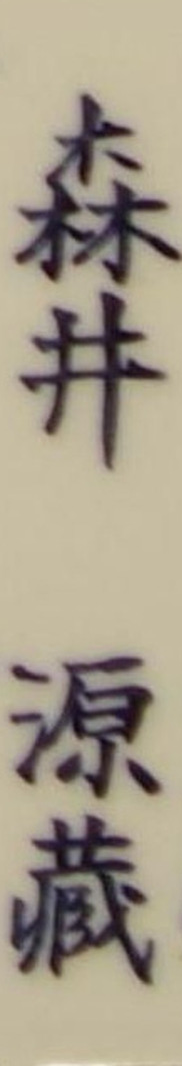森井源蔵
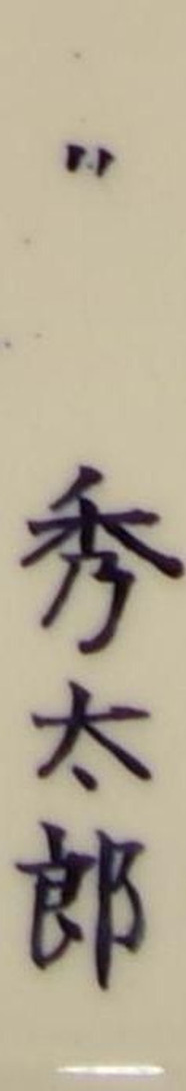秀太郎
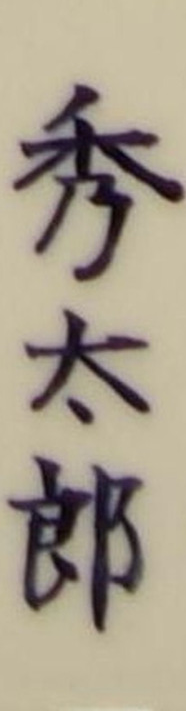秀太郎
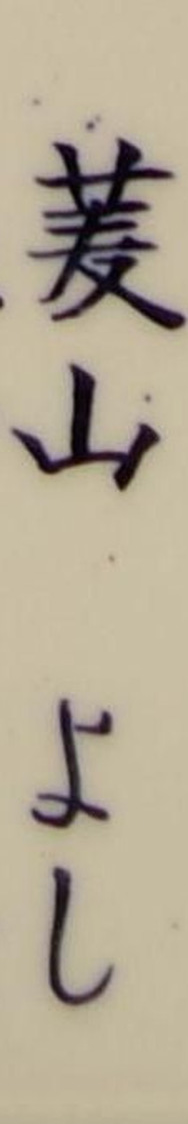菱山よし
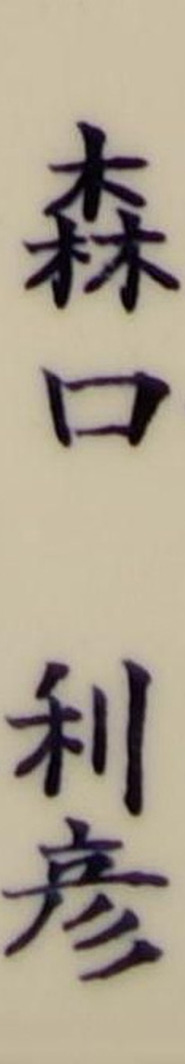森口利彦
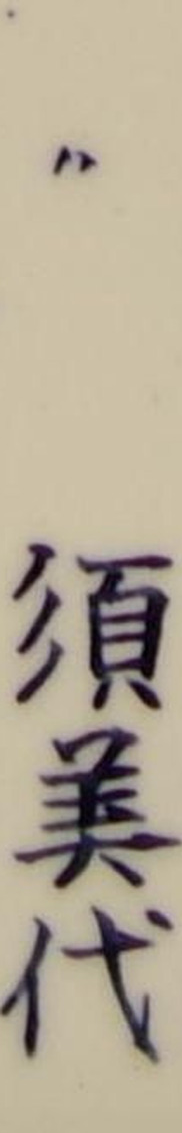須美代
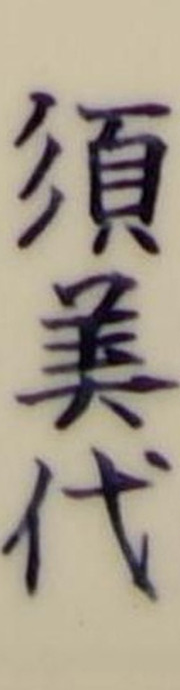須美代
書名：A~D
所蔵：koyasan kongobuji
